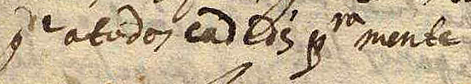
gde a todos e a de ds̄ pramente
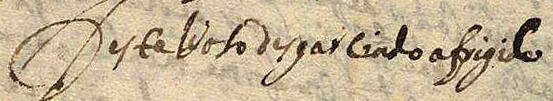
Deste Voso desgarciado afrigido
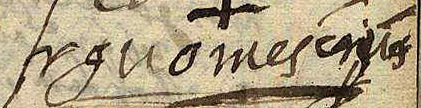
Frco guomes ēriques
